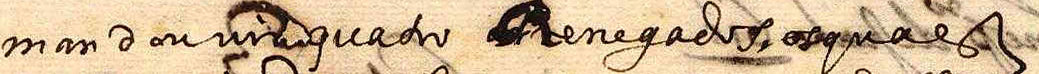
mandou uir quatro Renegados, os quaes
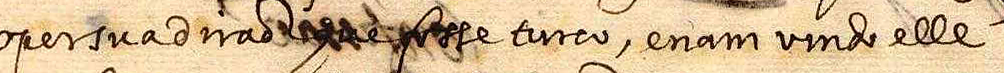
o persuadiraõ que fosse turco, e nam vindo elle
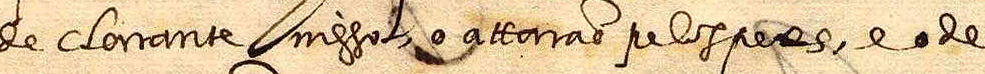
declarante nisso, o attaraõ pelos pees, e o de
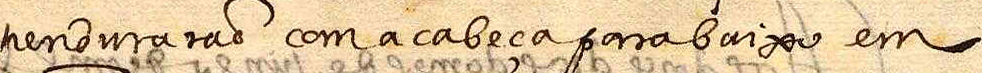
penduraraõ com a cabeça para baixo em
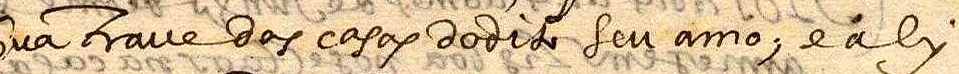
huā traue das casas do dito seu amo; e aly
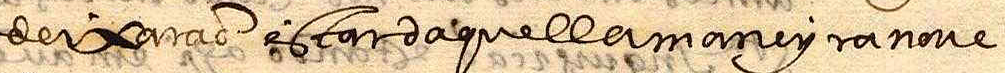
o deixaraõ estar daquella maneyra noue
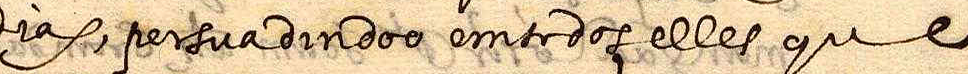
dias, persuadindoo em todos elles que
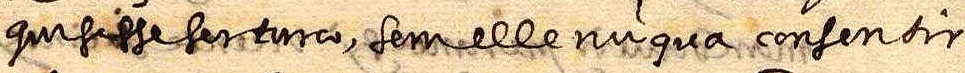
quisesse ser turco, sem elle nūqua consentir
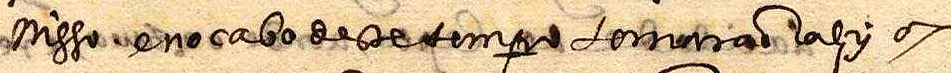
nisso e no cabo deste tempo tornaraõ ahy os
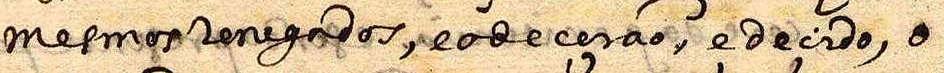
mesmos renegados, e o deceraõ, e decido, o
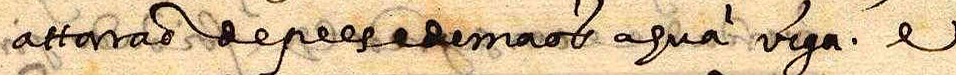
attaraõ de pees e de maõs a huā viga. E
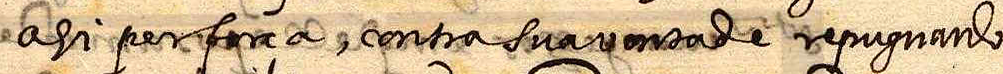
ahi per força, contra sua vontade repugnando
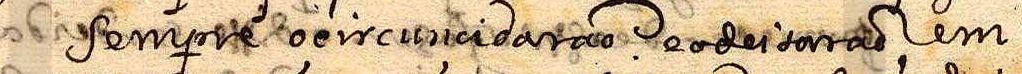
sempre o circuncidaraõ e o deitaraõ em
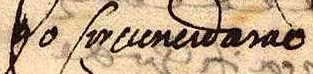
q̄ o Circuncidaraõ
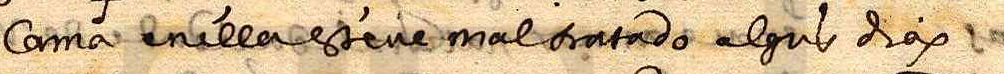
cama e nella esteue maltratado algūs dias
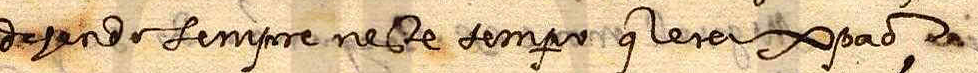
dezendo sempre neste tempo q̄ era xpaõ,
